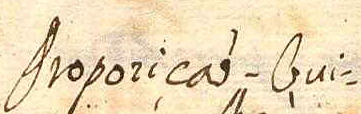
Propoziçaõ. Coui
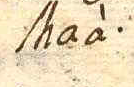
lhaã.
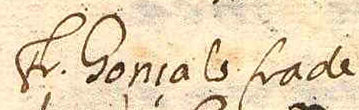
Fr. Gonçalo frade
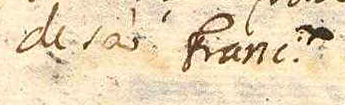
de saõ Franc.o
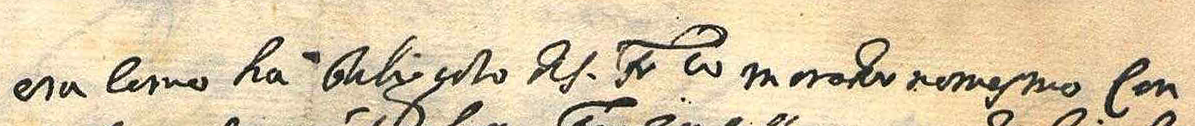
em Como ha Religiozo de S. Frco morador no mesmo Con
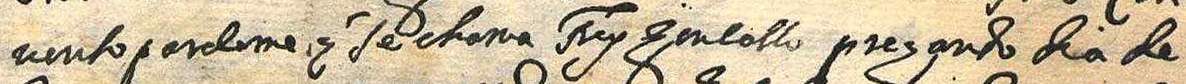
uento pareceme q̄ se chama Frey Gonçallo pregando dia de
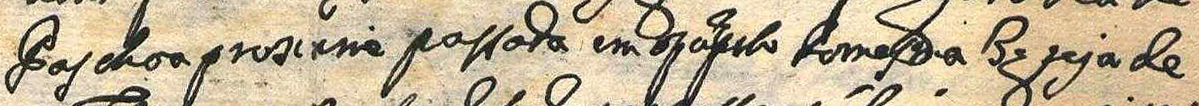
Paschoa proxime passada em o pulpito da mesma Igreja de
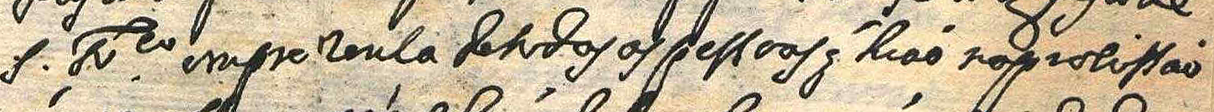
S. Fr.co em prezença de todas as pessoas q̄ hiaõ na procissaõ
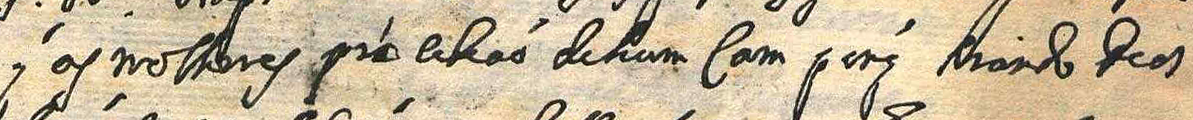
q̄ as molheres procediaõ de hum Cam porq̄ mando Deos
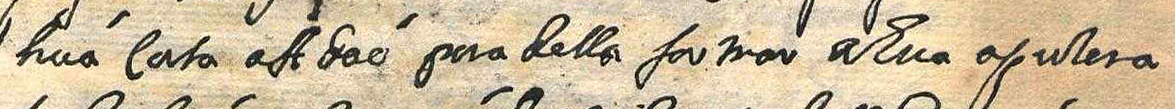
huā Carta a Adaõ pera della formar a hua a puzera
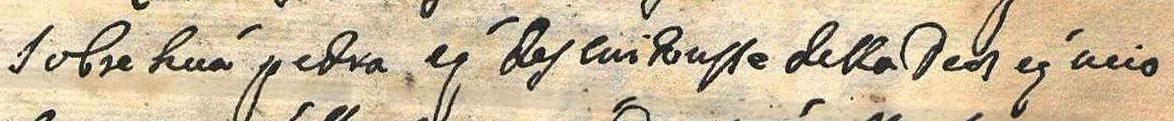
sobre huā pedra e q̄ descuidousse della Deos e q̄ ueio
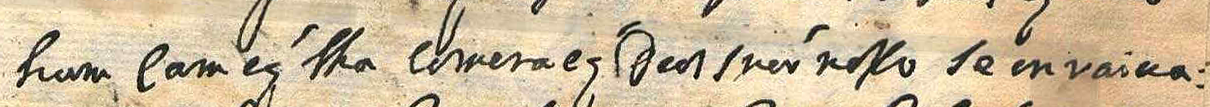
hum Cam e q̄ lha comera e q̄ Deos snor̄ nosso se enraiua
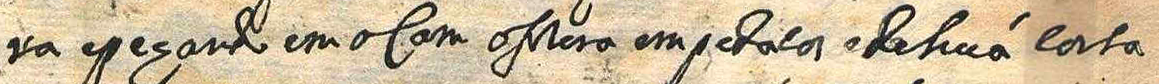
ra e pegando em o Cam o fizera em pedaços e de huā costa
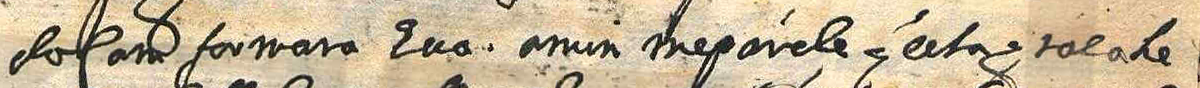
do Cam formara hua a mim me parece q̄ esta graça he
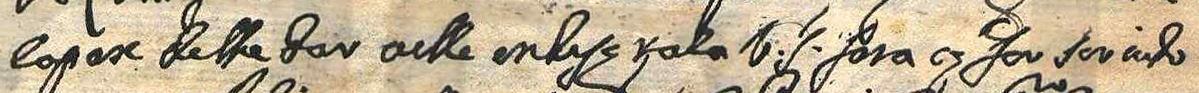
capaz de lhe dar a elle en desgraça v. s. fara q̄ for seruido
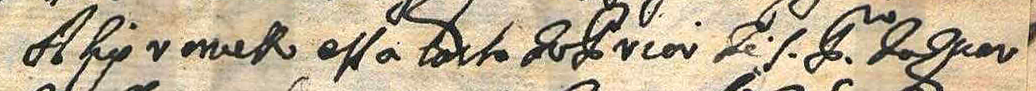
Ahy remetto esta carta do Prior de S. P.o da Guar
